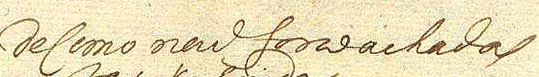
de Como naõ foraõ achadas
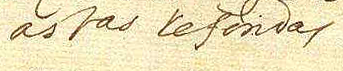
as tas referidas
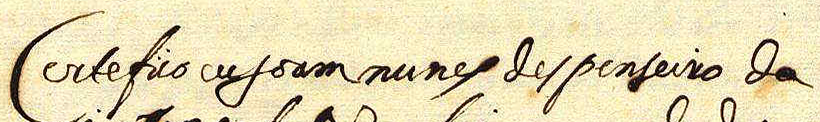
Certefico eu Joam nunes despenseiro da
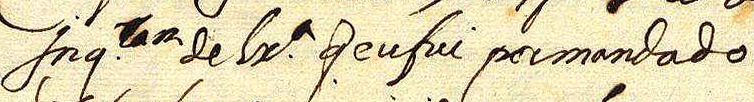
Jnq.cam de lx.a q̄ eu fui por mandado
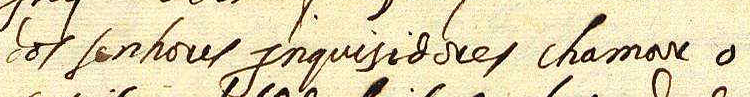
dos senhores jnquisidores chamar o
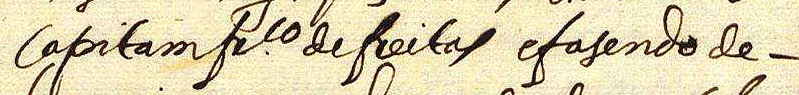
Capitam fr.co de freitas e fasendo de
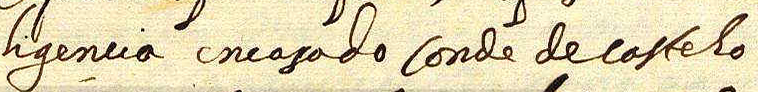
ligencia en casa do Conde de castelo
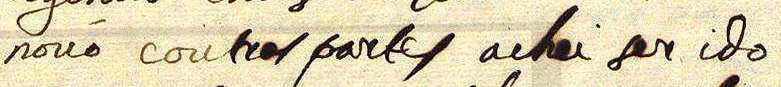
nouo e outras partes achei ser ido
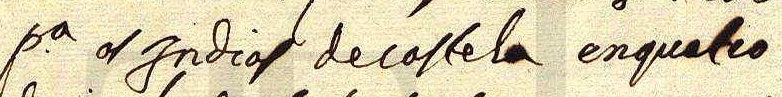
p.a os Jndias de castela en quatro
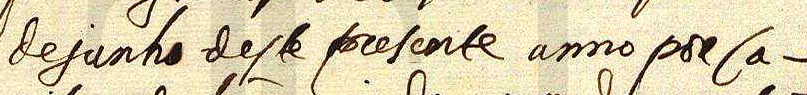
de junho deste presente anno por Ca
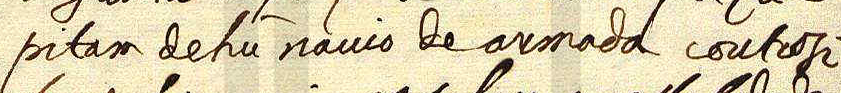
pitam de hū nauio de armada e outrosi
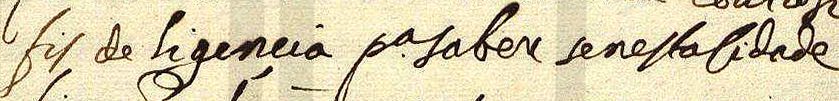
fis deligençia p.a saber se nesta Cidade
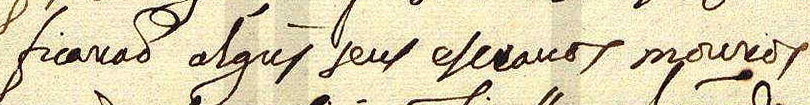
ficaraõ algūs seus escrauos mouros
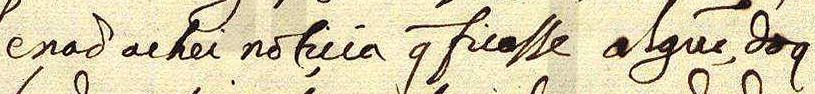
e naõ achei noticia q̄ ficasse algūs do q̄
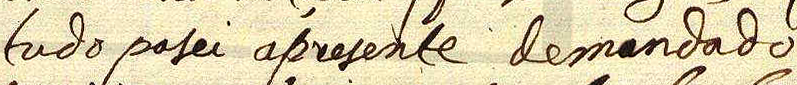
tudo pasei a presente de mandado
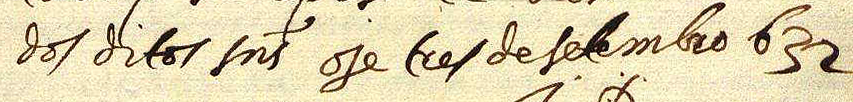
dos ditos sns̄ oje tres de setembro 632
